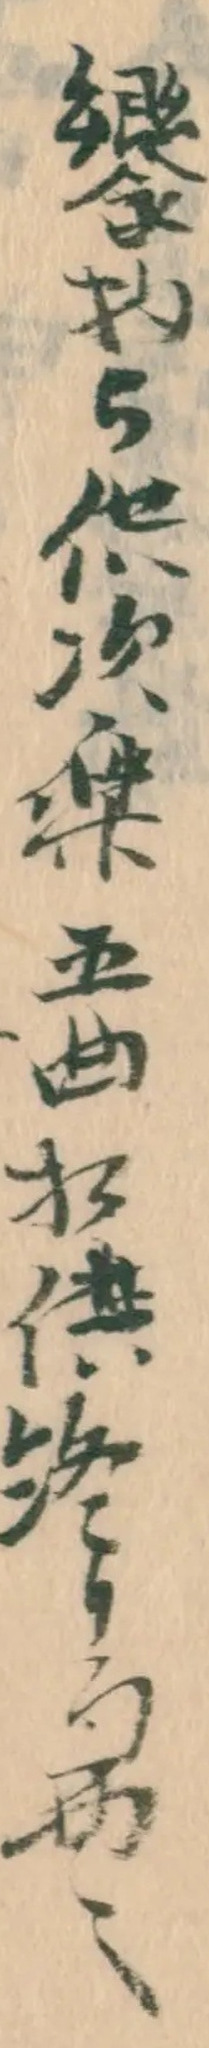饗物被供次楽五曲相供終り而西之
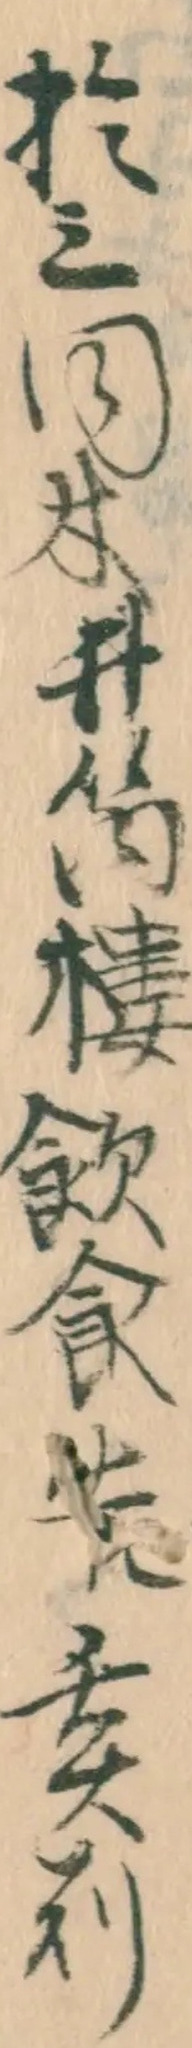拾三同木井筒楼飲食出ル亥刻
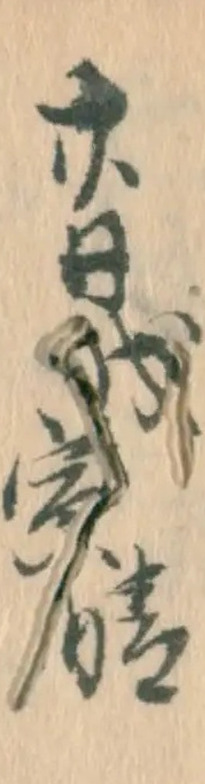廿日戊寅晴
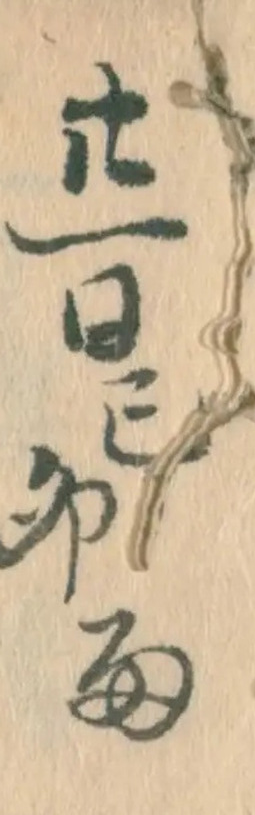廿一日己卯雨
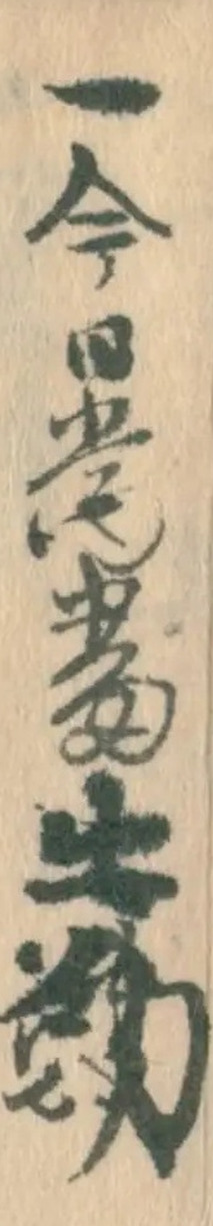一今日当番出勤
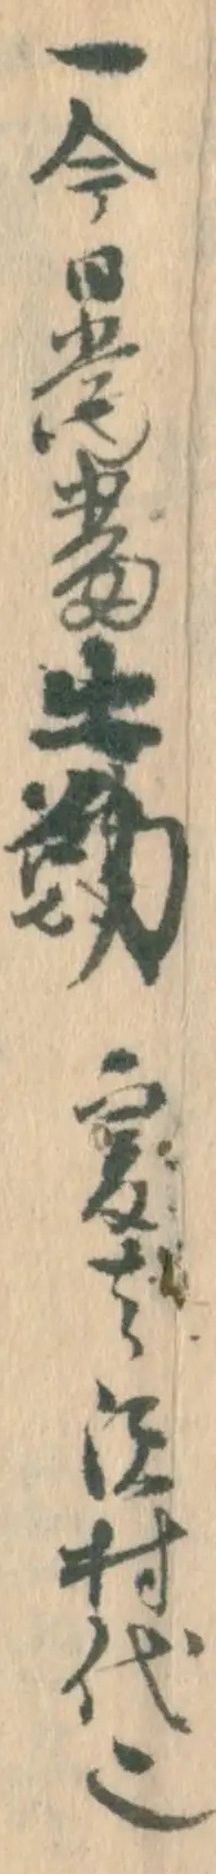一今日当番出勤宸は沢村代也
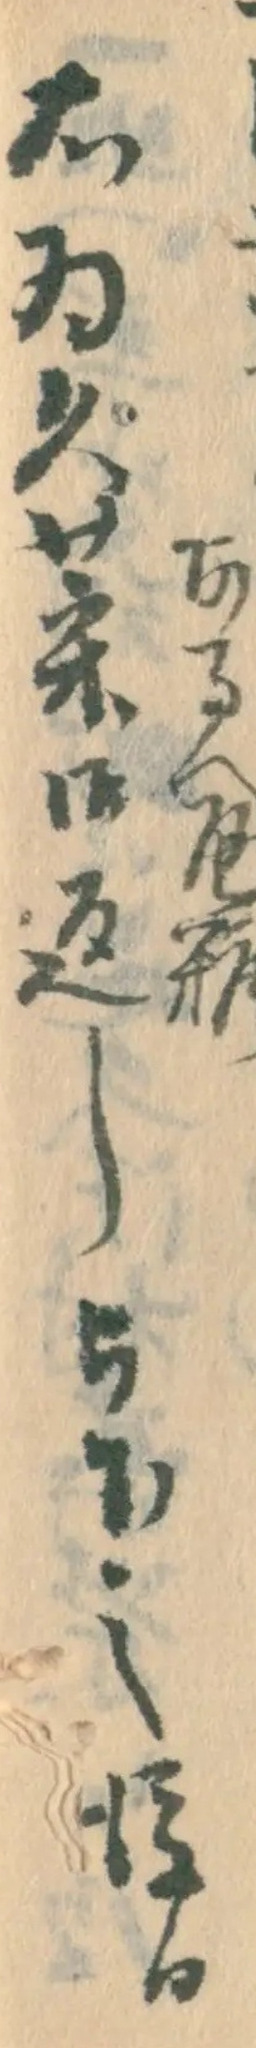右為久菜御返し被下之後日

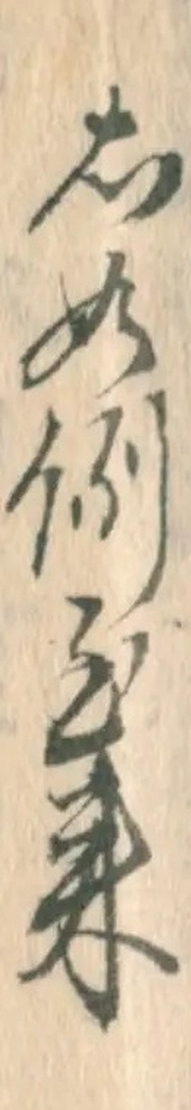右如例到来
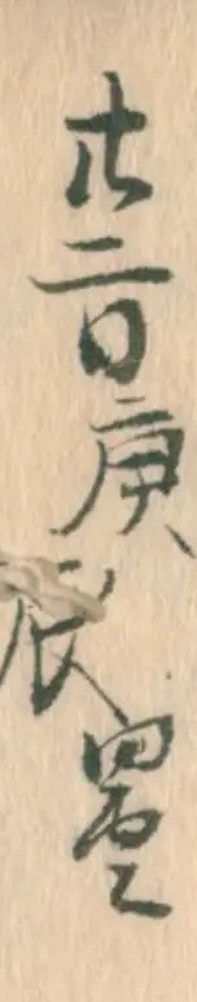廿二日庚辰曇
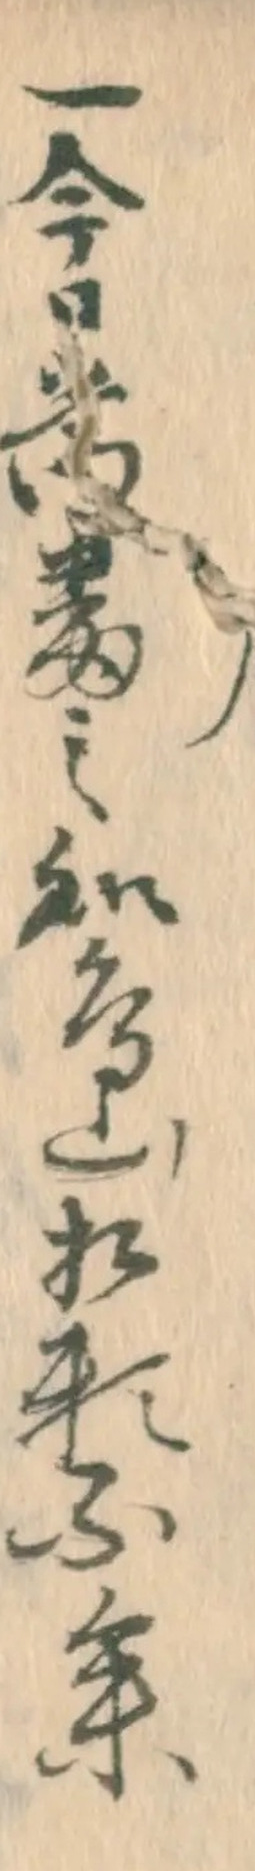一今日当番之処鳥山相頼不参
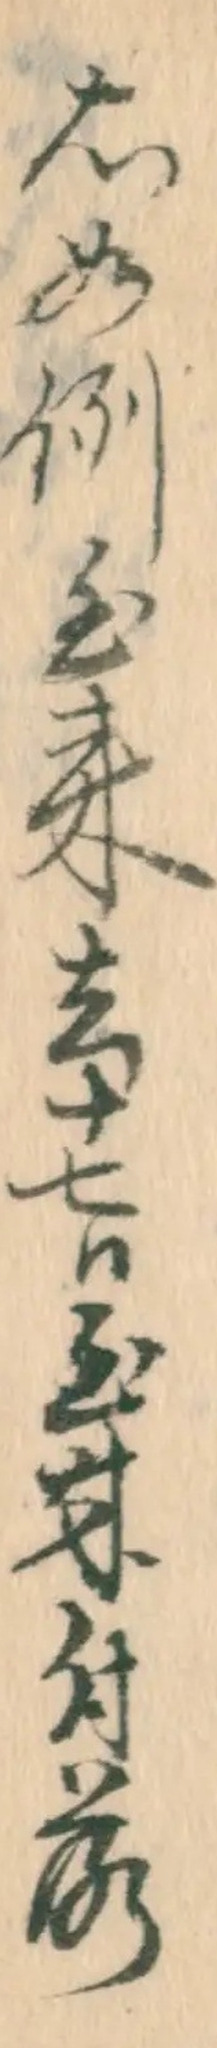右如例到来去十七日到来付落
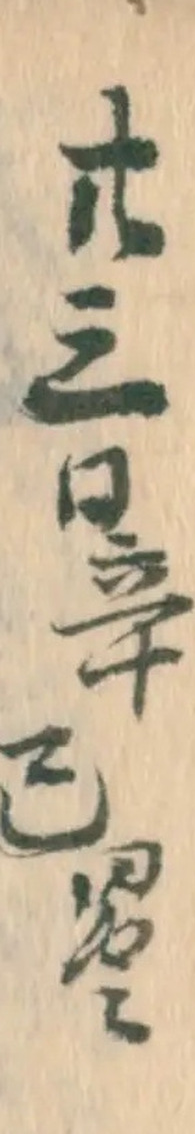廿三日辛巳曇
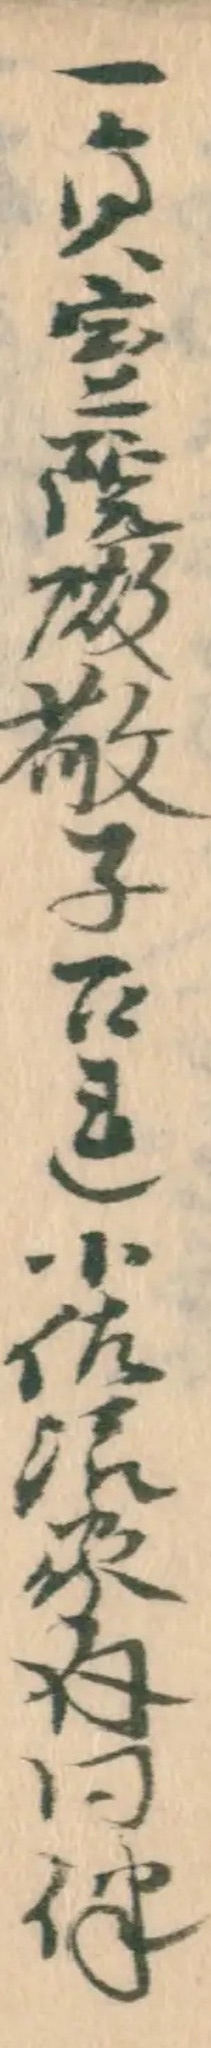一貞室院殿敬子召連小佐治家内同伴
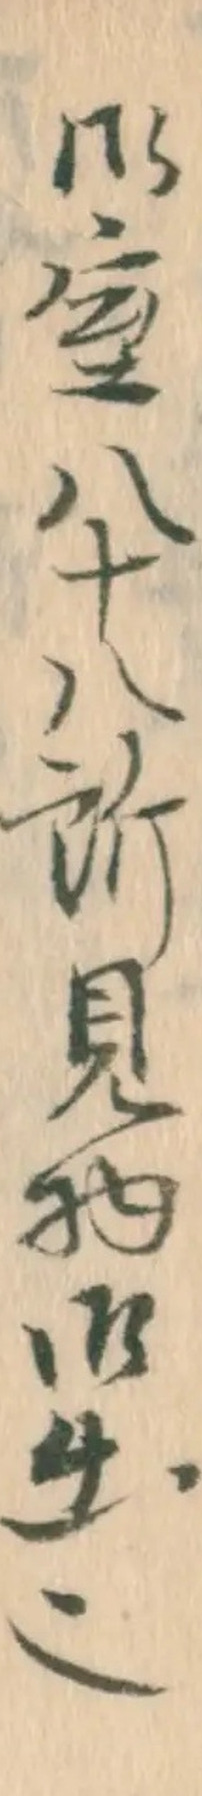御室八十八所見物御出也
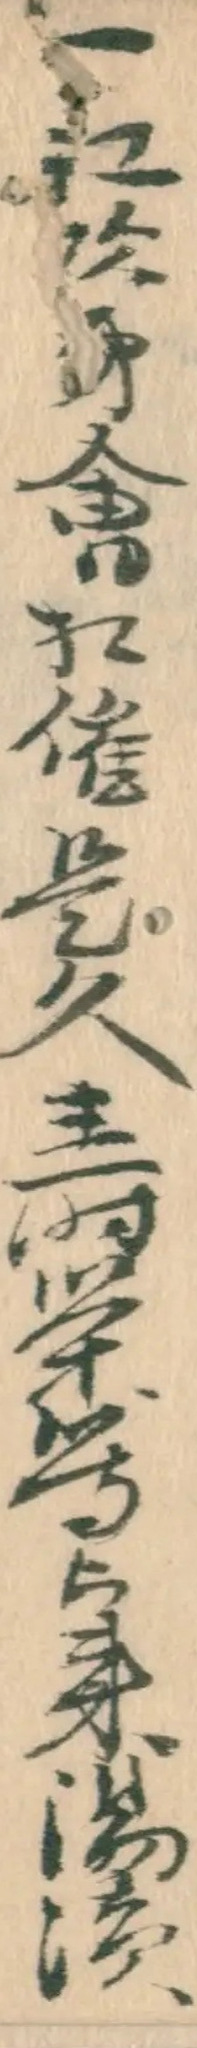一江次第会相催是久寿栄等被来湯漬
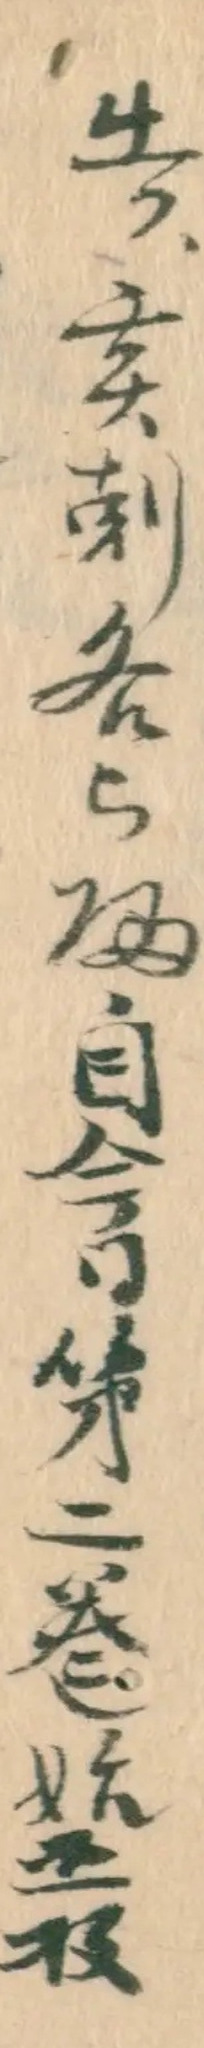出ス亥刻各被帰自今日第二巻始五枚
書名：禁裏御所御用日記. [131]
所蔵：国立国会図書館 National Diet Library, JAPAN
